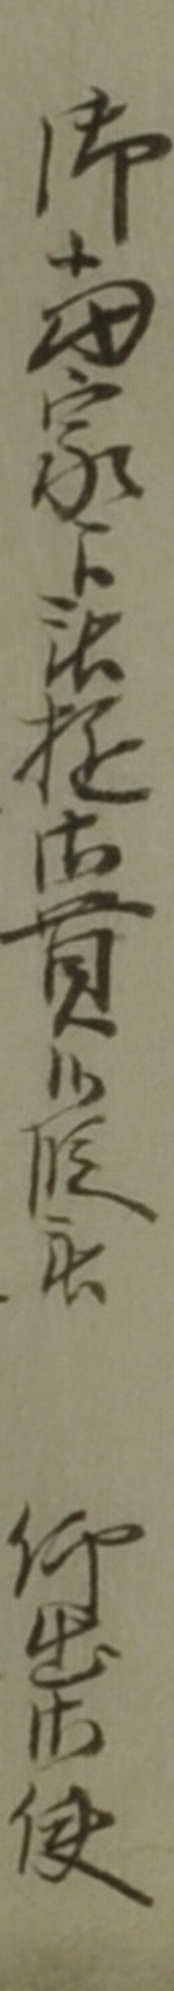御当家江被遊御貢候段被仰出御使
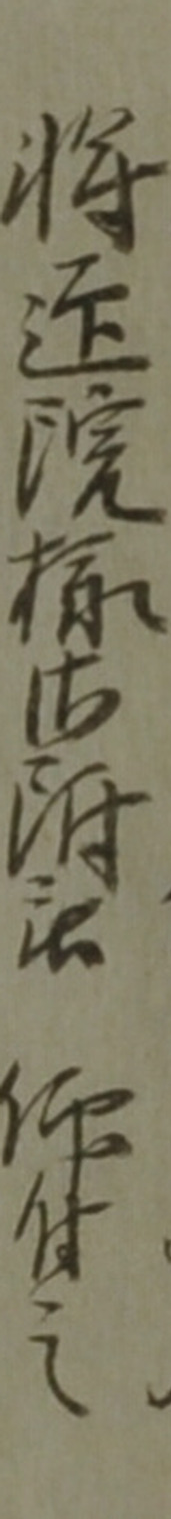将迎院様御附被仰付之
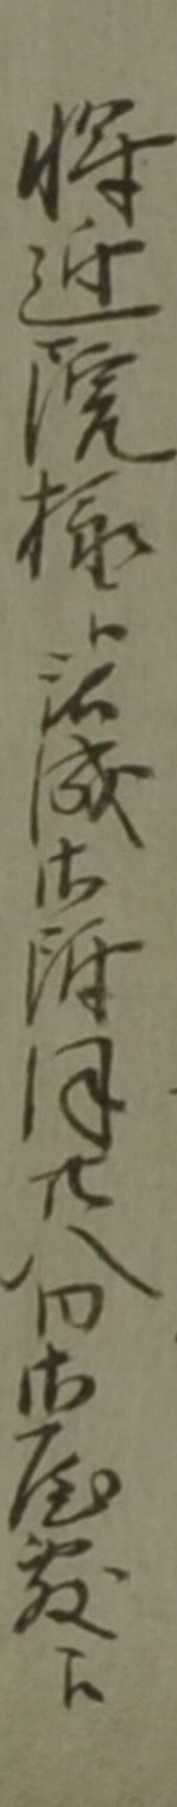将迎院様江被成御附同廿八日御屋敷江
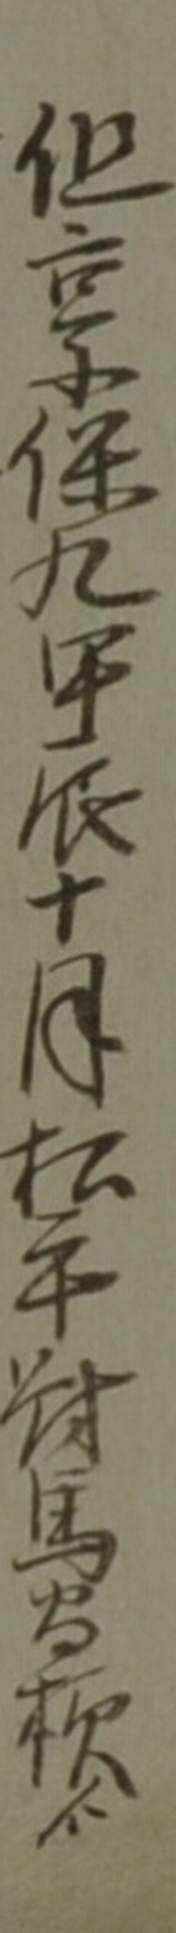但享保九甲辰十月松平対馬守様ゟ
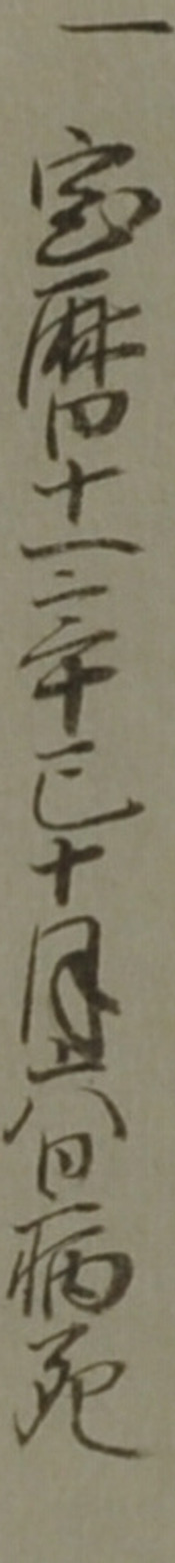一宝暦十一辛巳十月六日病死
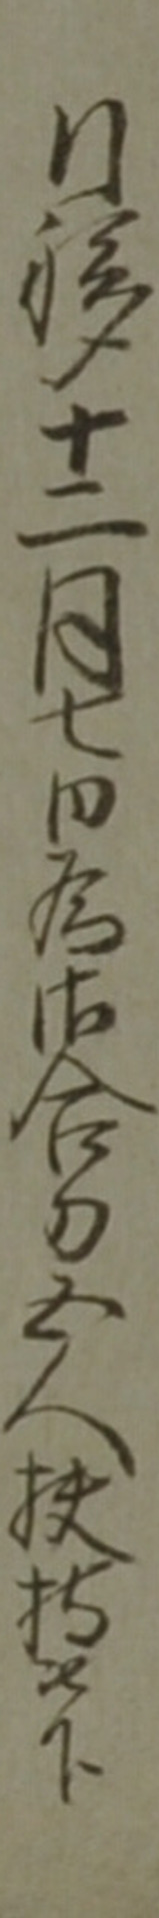引移十二月七日為御合力五人扶持被下
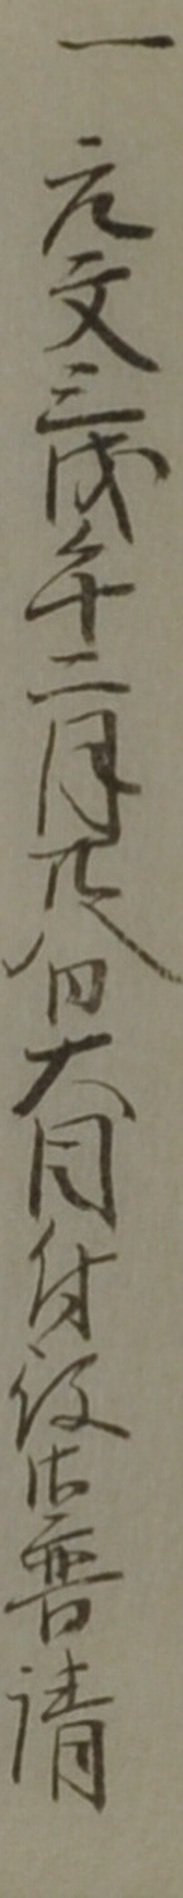一元文三戊午二月廿八日大目付役御普請
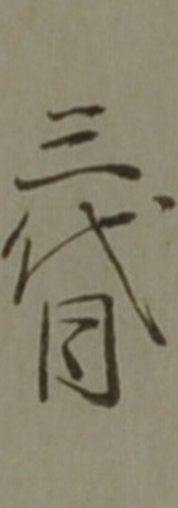三代目
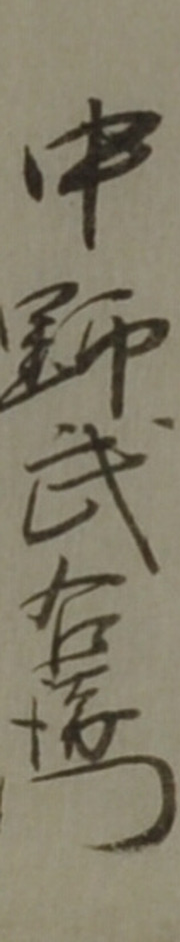中野武右衛門
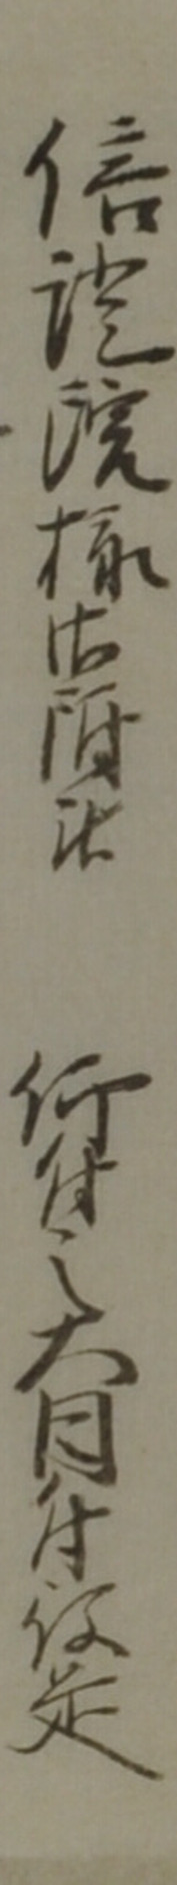信証院様御附被仰付之大目付役是
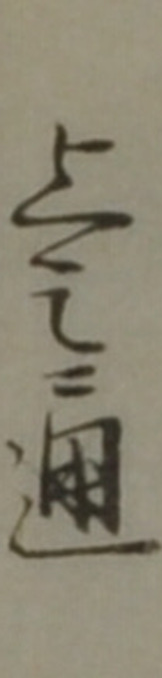迄之通
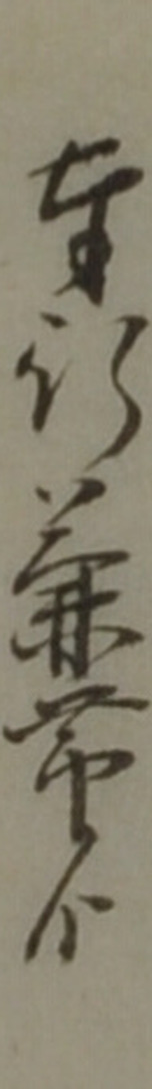奉行兼帯ゟ
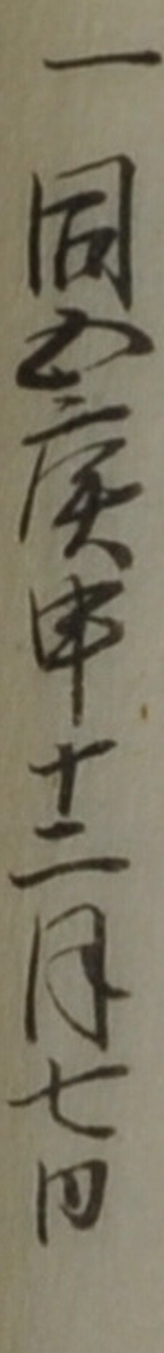一同五庚申十二月七日
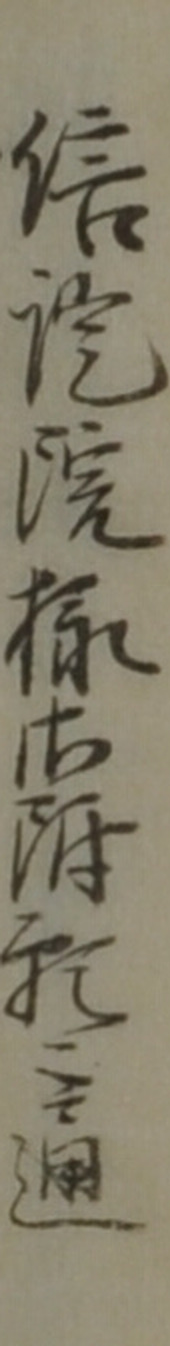信証院様御附願之通
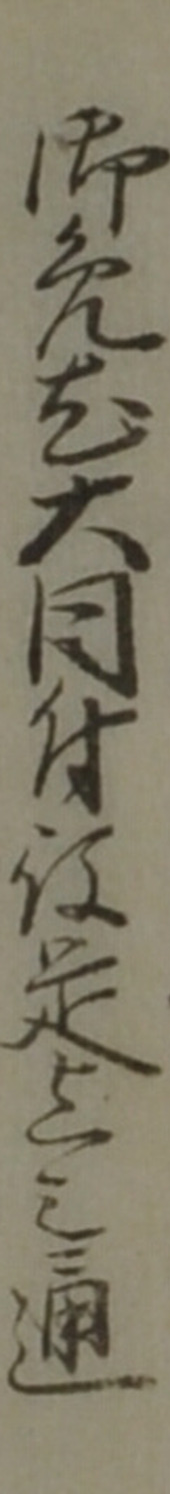御免尤大目付役是迄之通
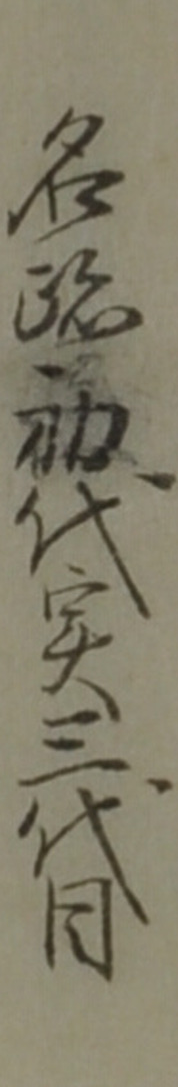名跡初代実三代目
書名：諸御役代々録（六）
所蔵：伊那市立高遠町図書館・合同会社AMANE
